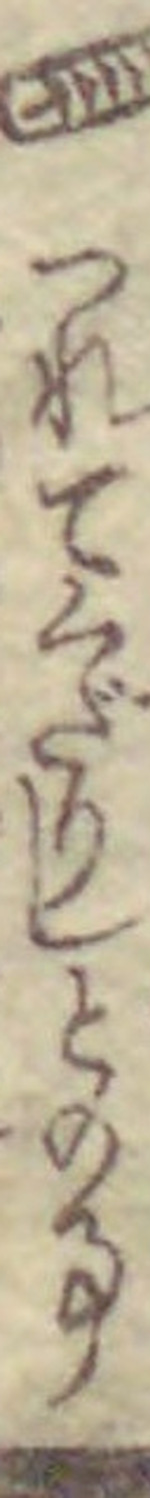つれてくだりしとの事
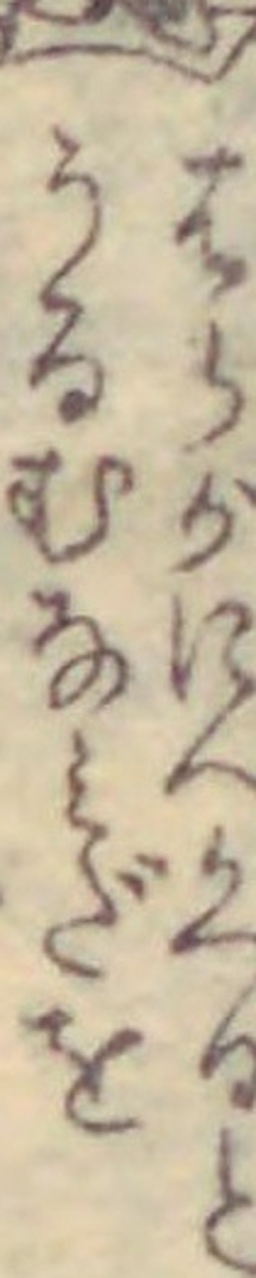うるむなみだを
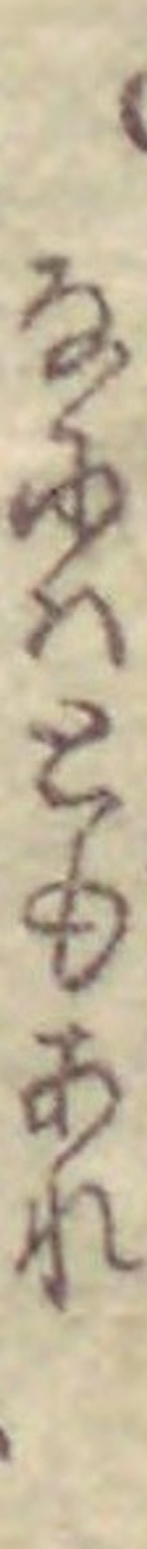なにはともあれ
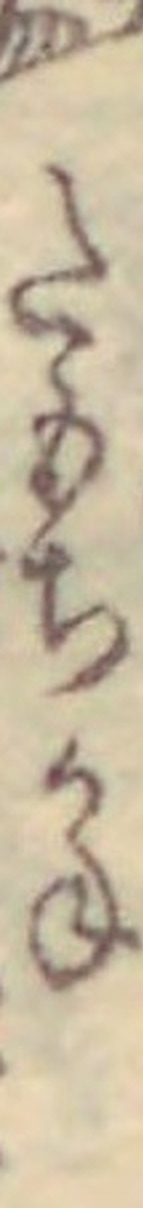たもちかね
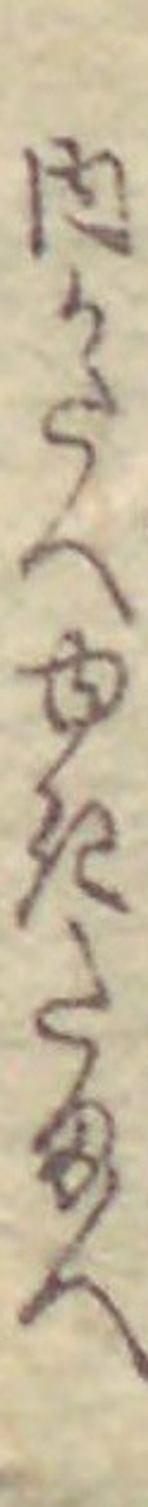内かたへゆきたまへ
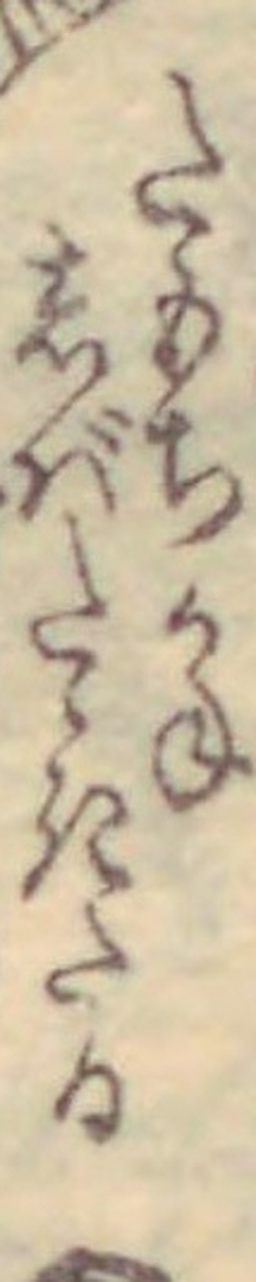しばたゝきたる
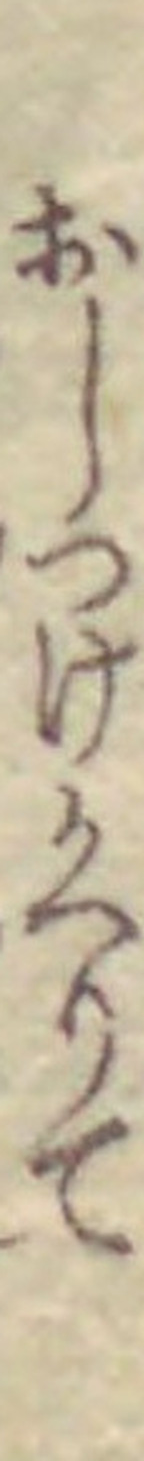おしつけかへりて
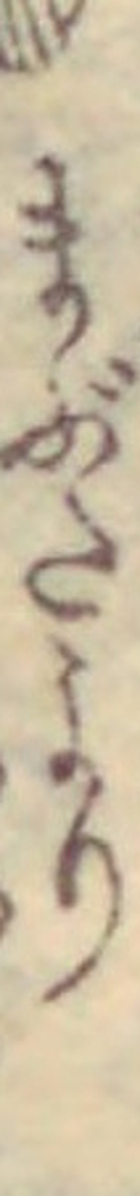まぶたより
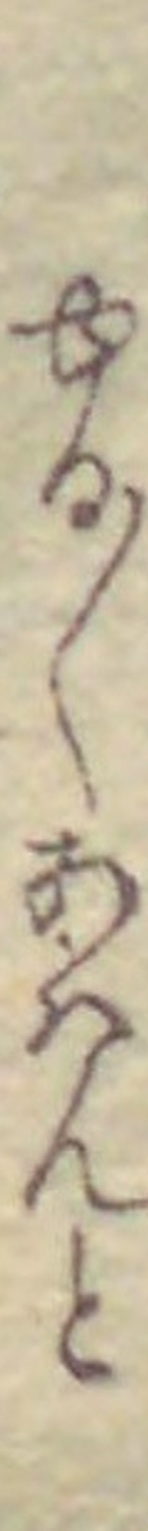ゆる〳〵あはんと
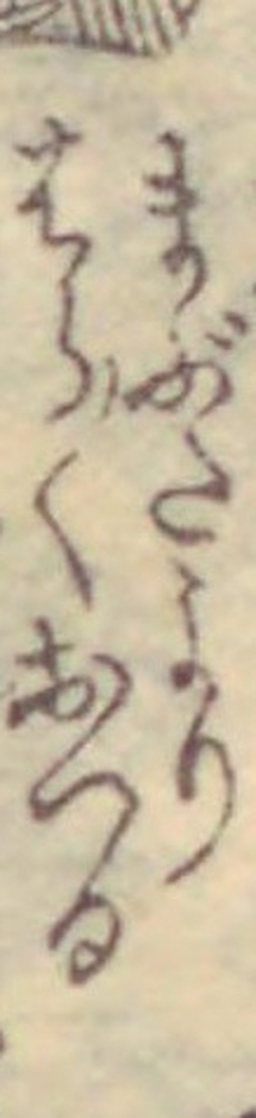はら〳〵おつる
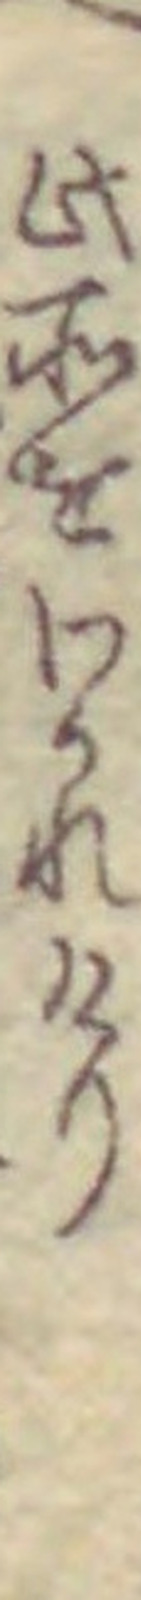此所をわかれけり
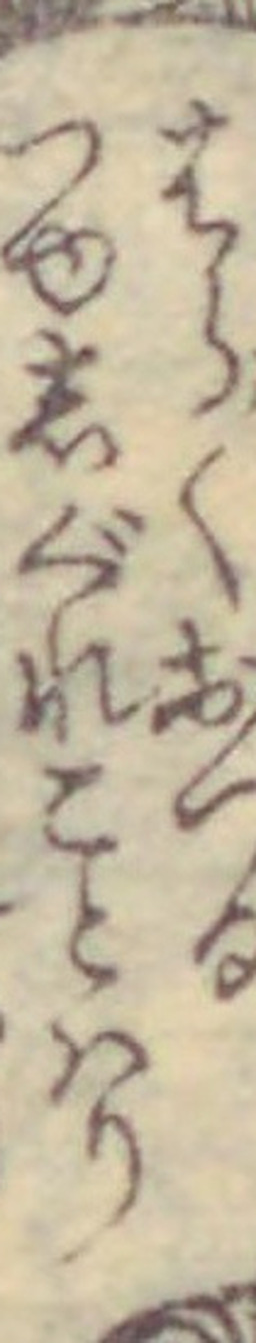つゆしぐれことはり
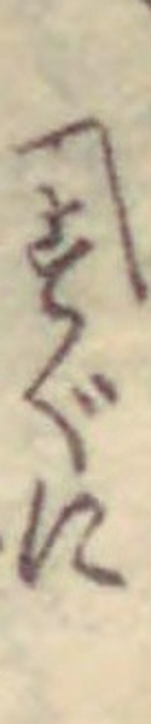〽すぐに
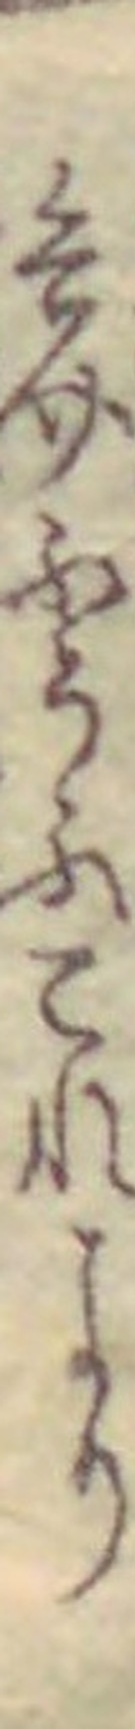兵介ふうふこれより
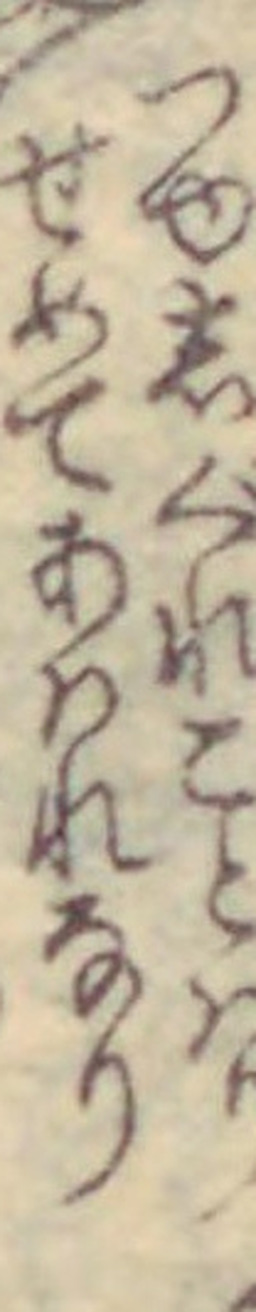せめてあはれなり
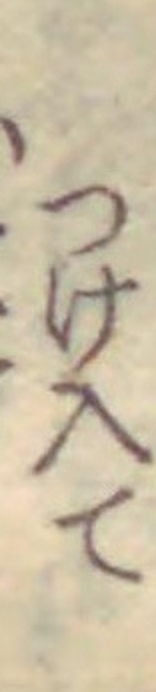つけ入て
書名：八ツ目鱣因縁物語 3巻
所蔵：国立国会図書館 National Diet Library, JAPAN
